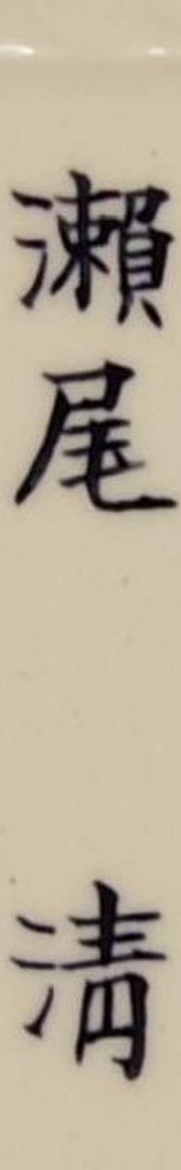瀨尾清
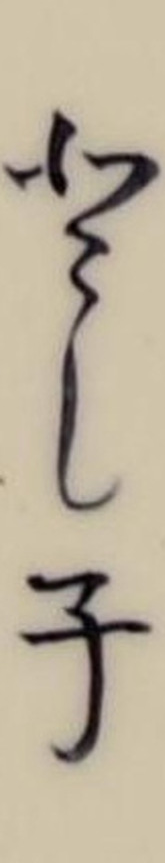とし子
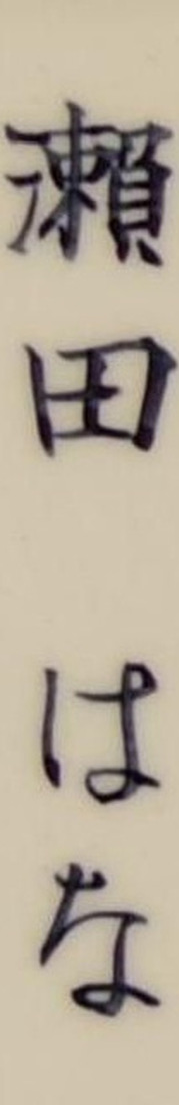瀨田はな
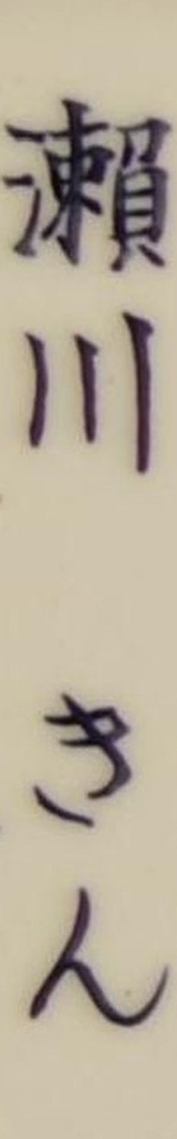瀨川きん

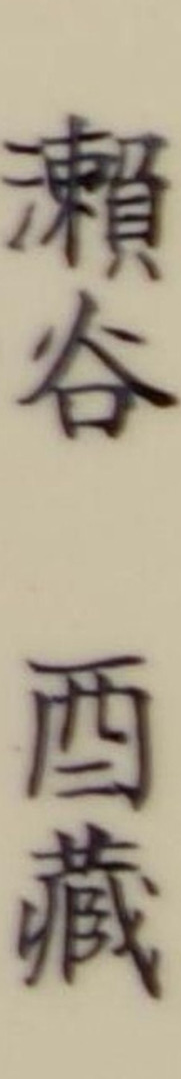瀨谷西蔵
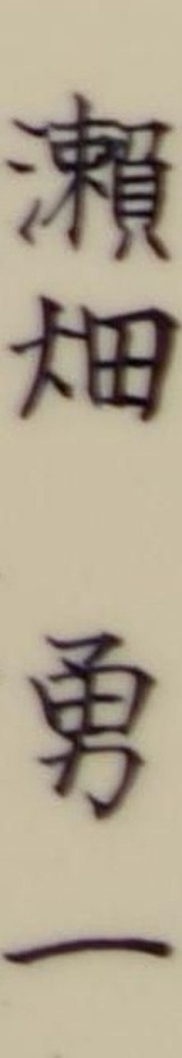瀨畑勇一
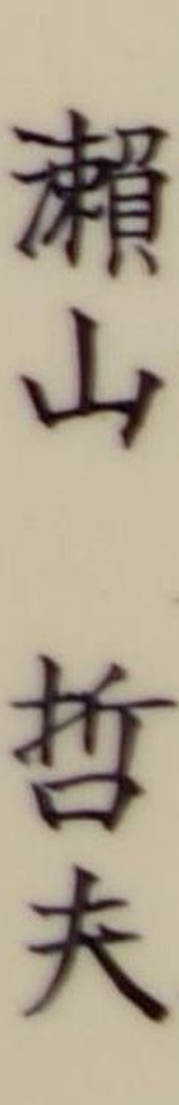瀨山哲夫
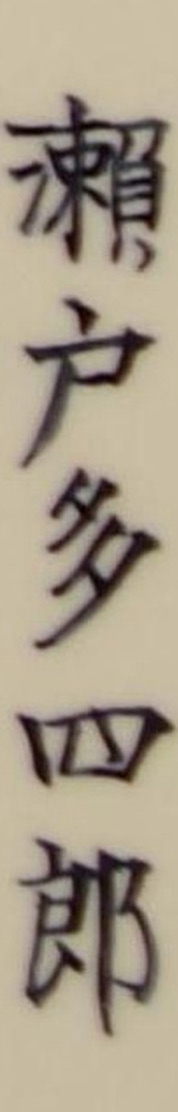瀨戸多四郎
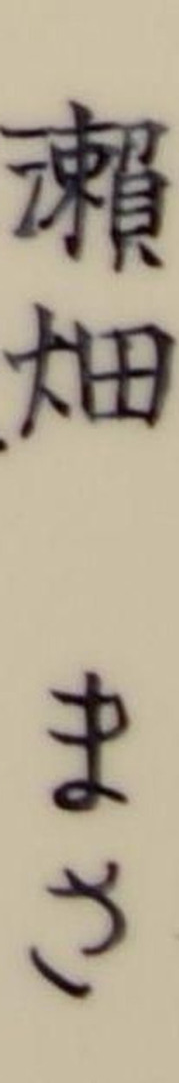瀨畑まさ
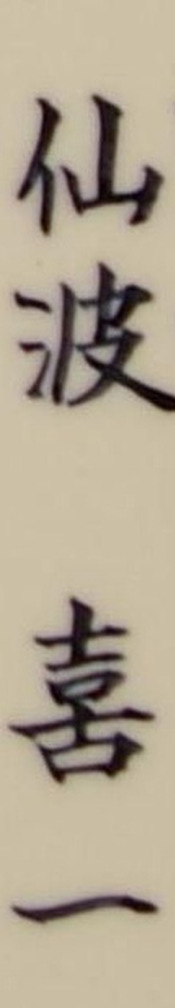仙波喜一
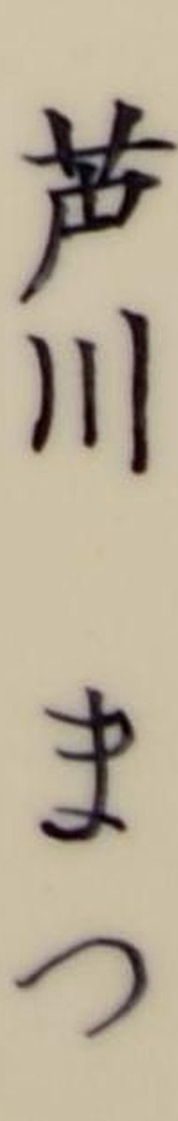芦川まつ
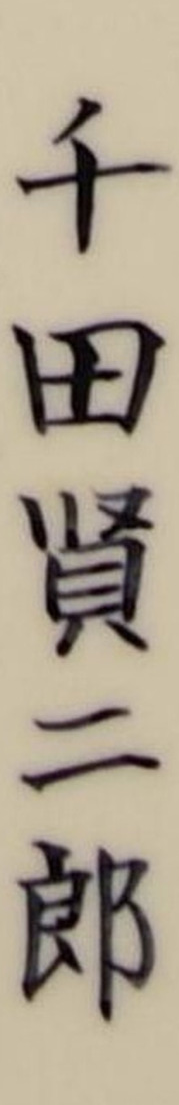千田賢二郎
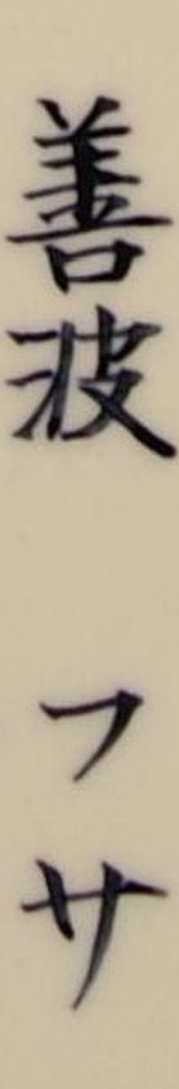善波フサ
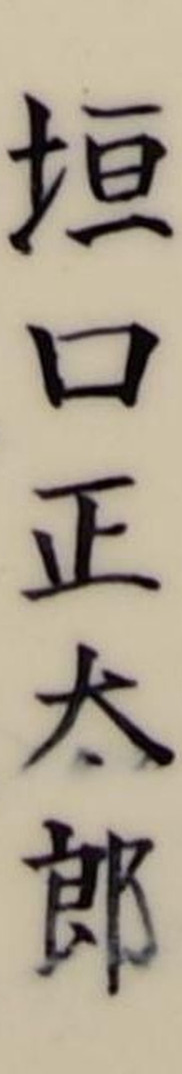垣口正太郎
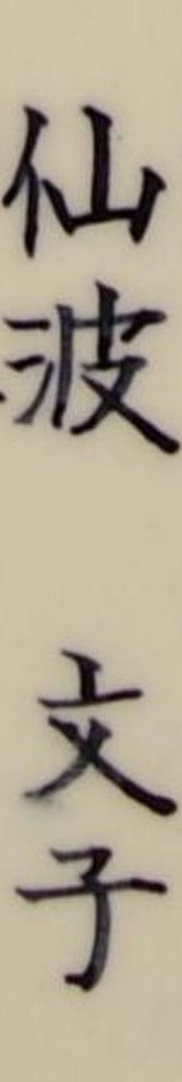仙波文子
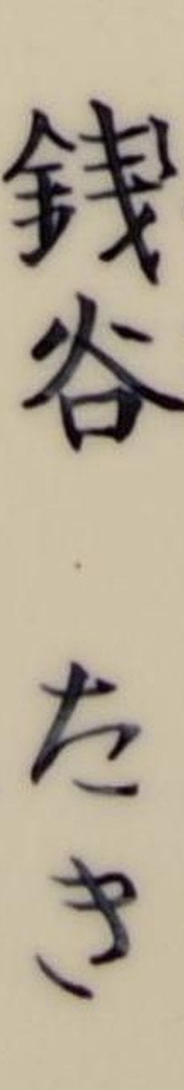銭谷たき
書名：A~D
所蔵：koyasan kongobuji
